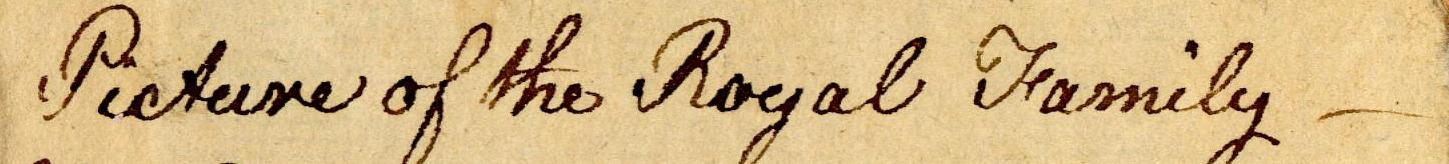Picture of the Royal Family-
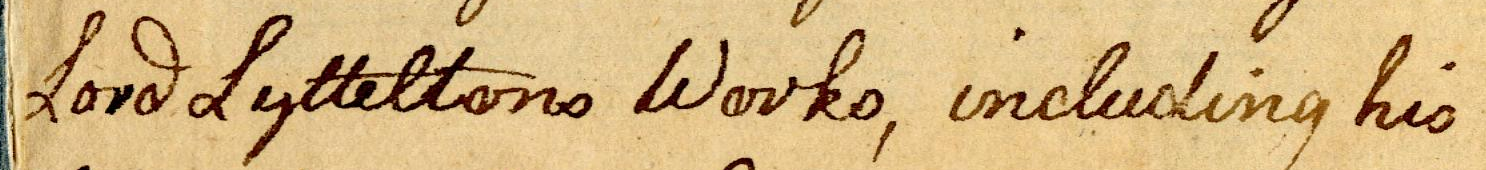Lord Lytteltons Works, including his
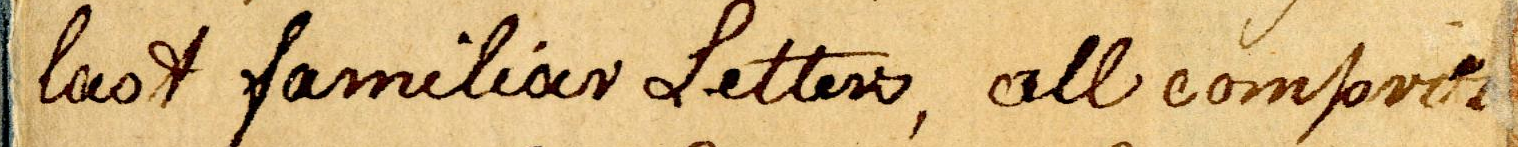last familiar Letters, call compri
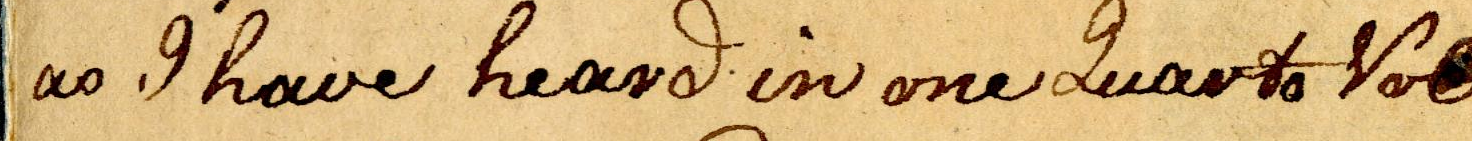as I have heard in one Quarts Vol
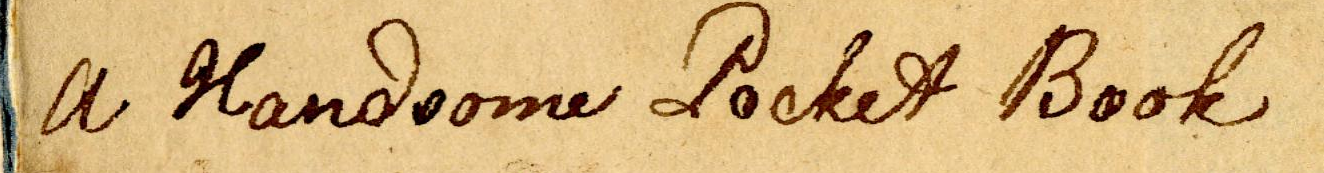A Handsome Pocket Book
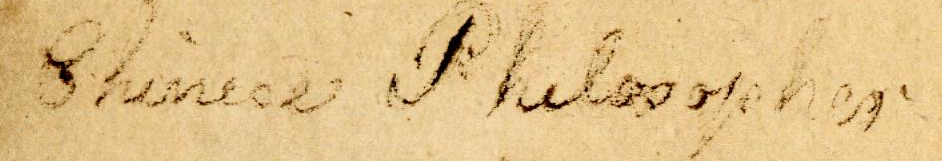Chinese Philosopher
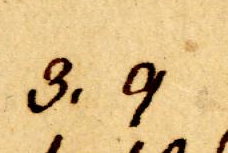3. 9
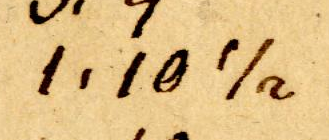1.10 1/2
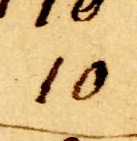10
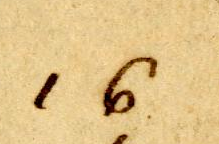16
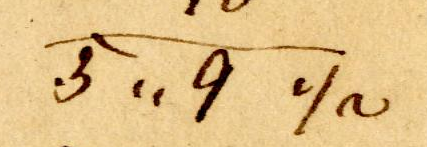5.. 9 1/2
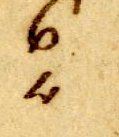4
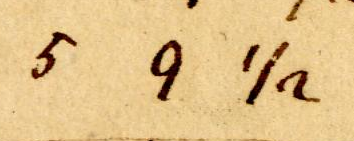5 9 1/2
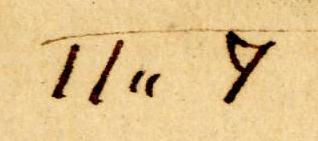11.. 7
